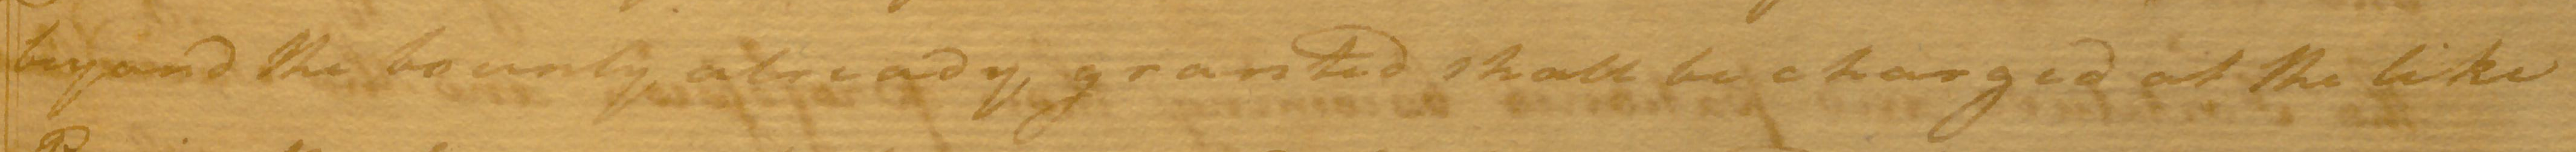beyond the bounty already granted shall be charged at the like
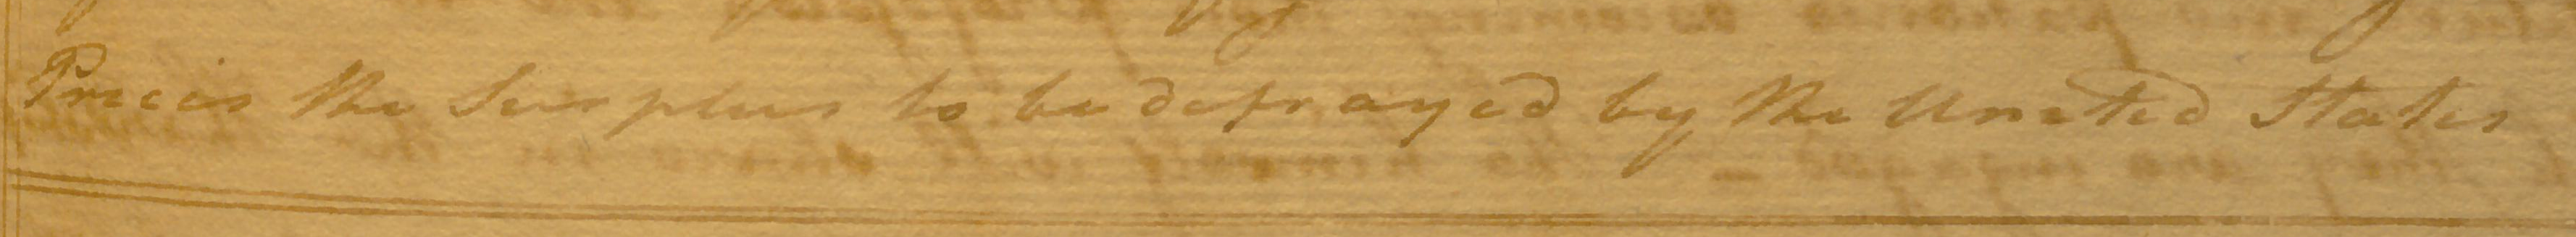Prices the Surplus to be defrayed by the United States
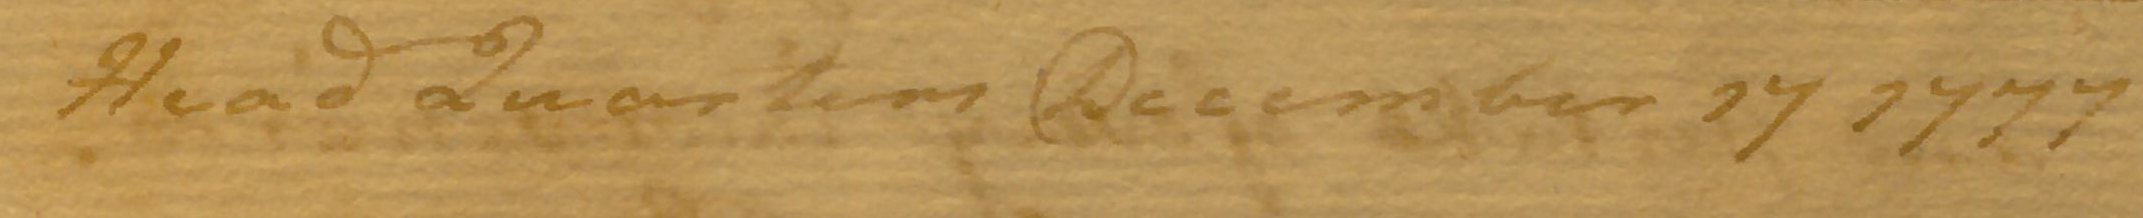Head Quarters December 17 1777
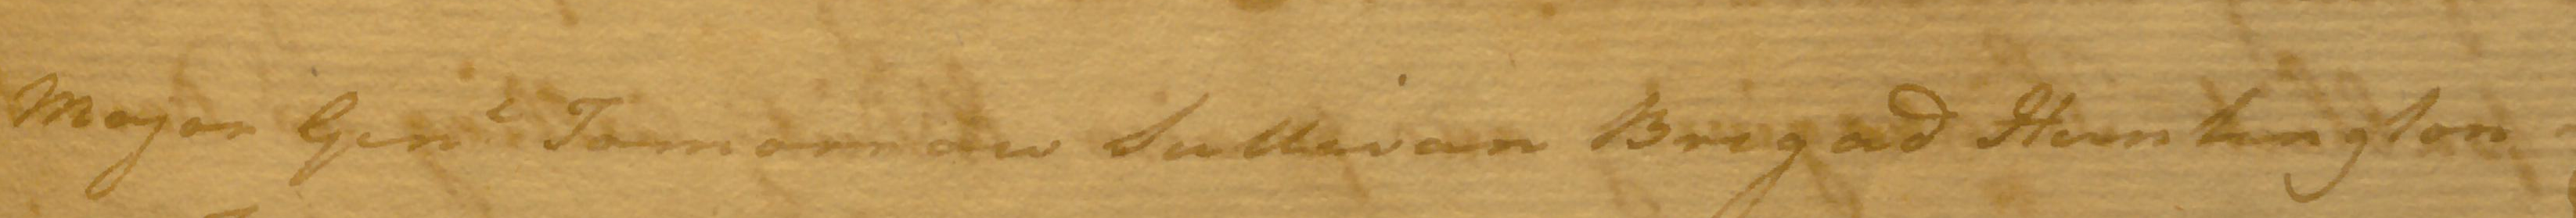Major Gen^l Tomorrow Sullivan Brigad Huntington
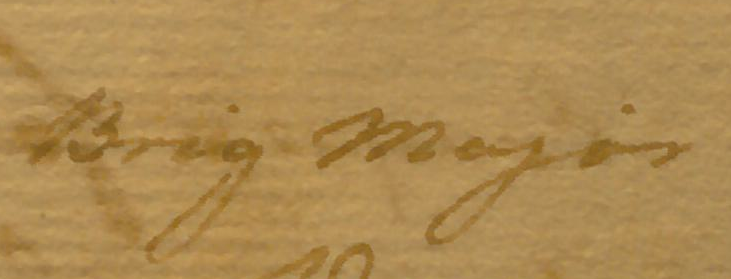Brig Major
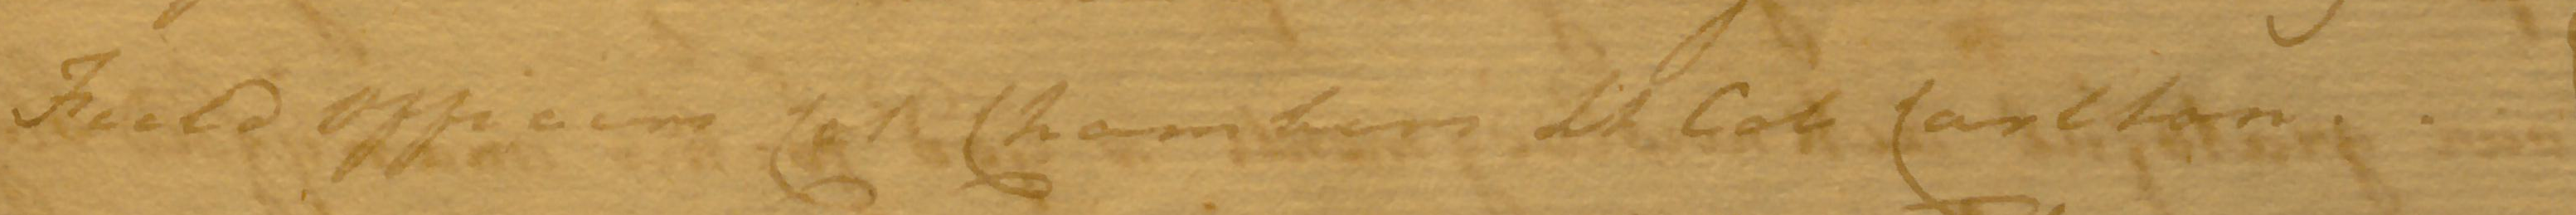Field officers Col Chambers Lt Col Carlton. ..
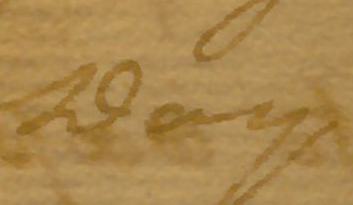Day
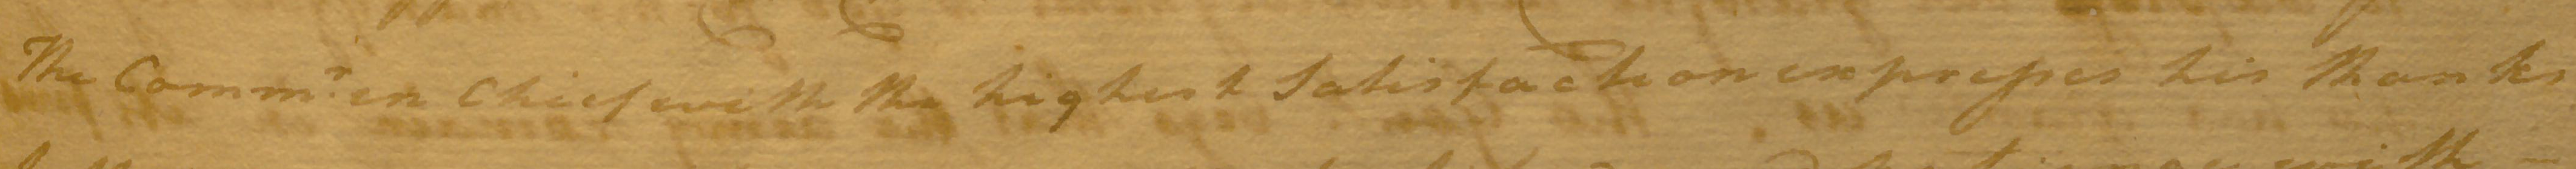The Comm^r. in Chief with the hightest Satisfaction expresses his thanks
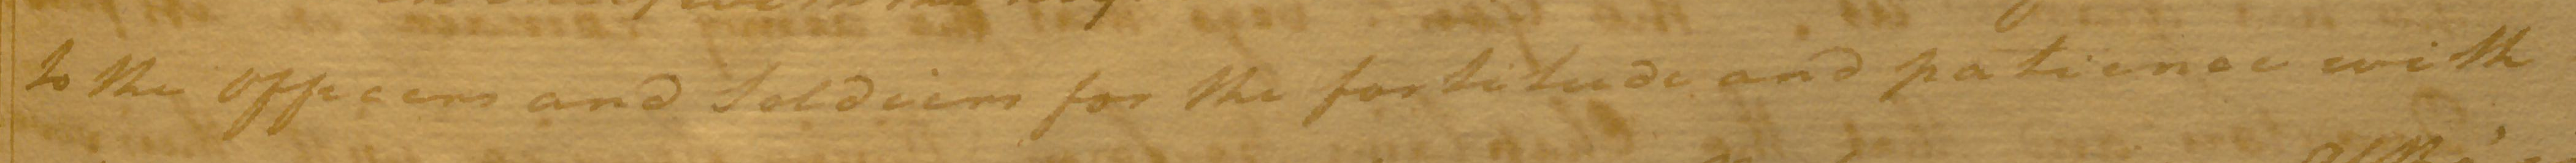to the officers and Soldiers for the fortitude and patience with
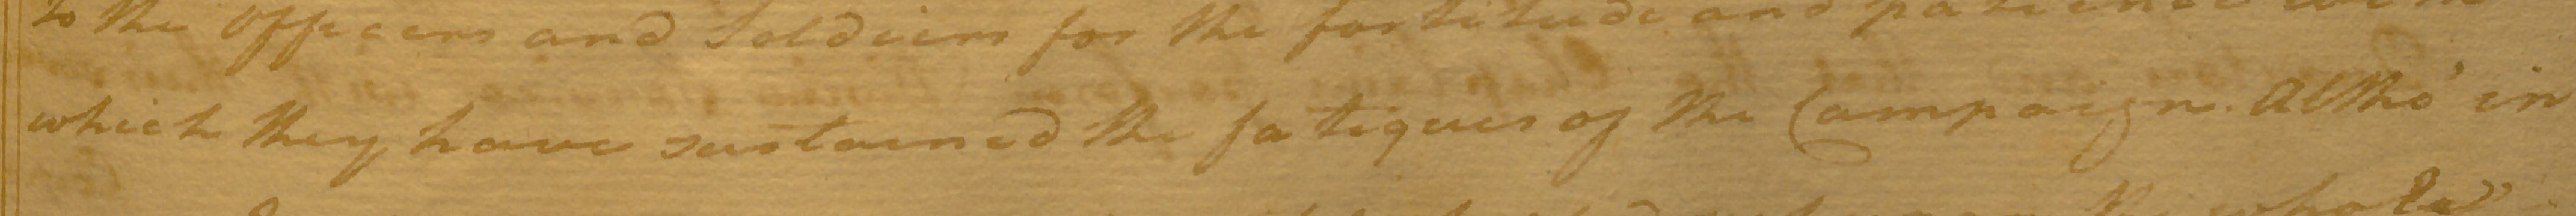which they have sustained the fatigues of the Campaign. Altho' in
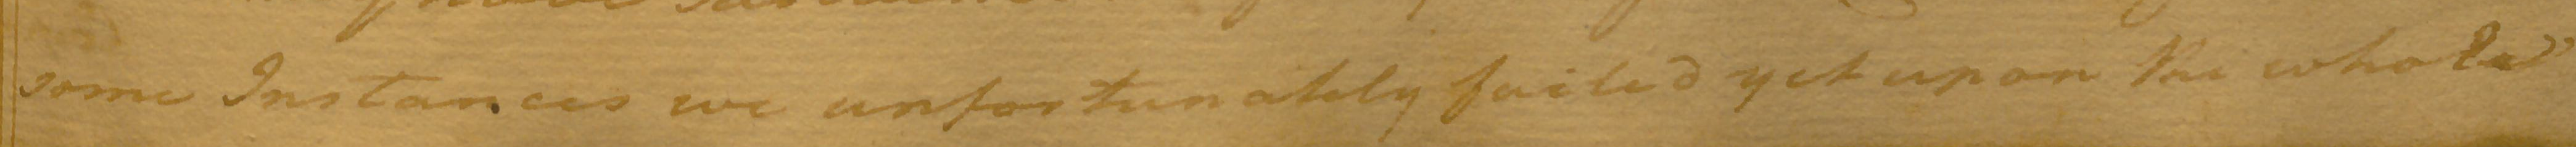some Instances we unfortunately failed yet upon the whole
